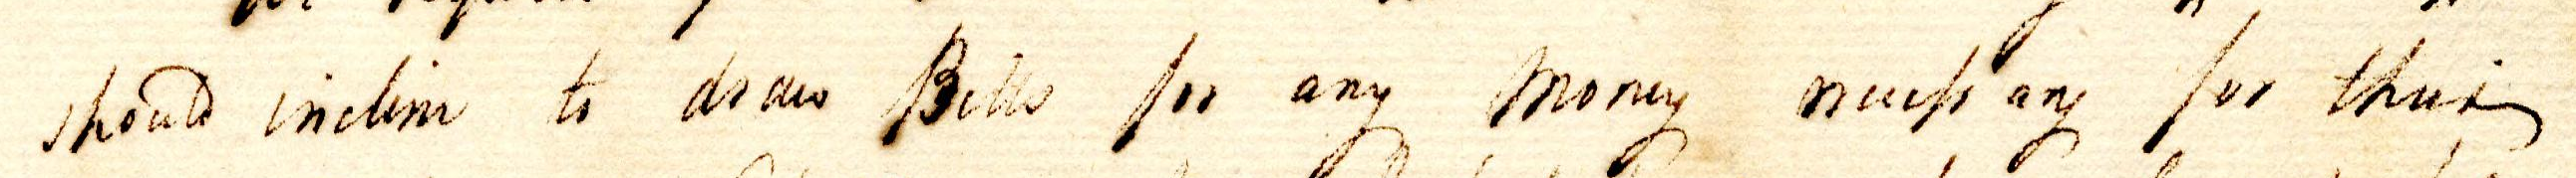should incline to draw Betts for any Money necessary for that
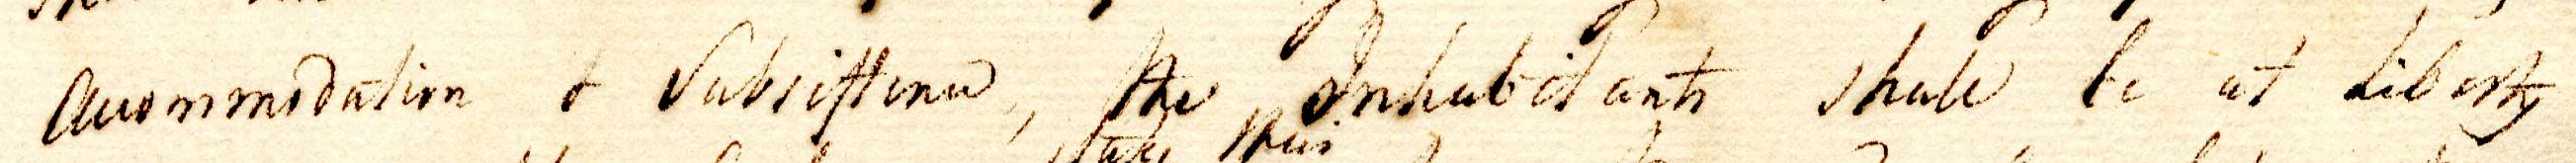Accommodation & Subscription, the Inhabitants shall be at Liberty
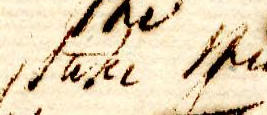take their
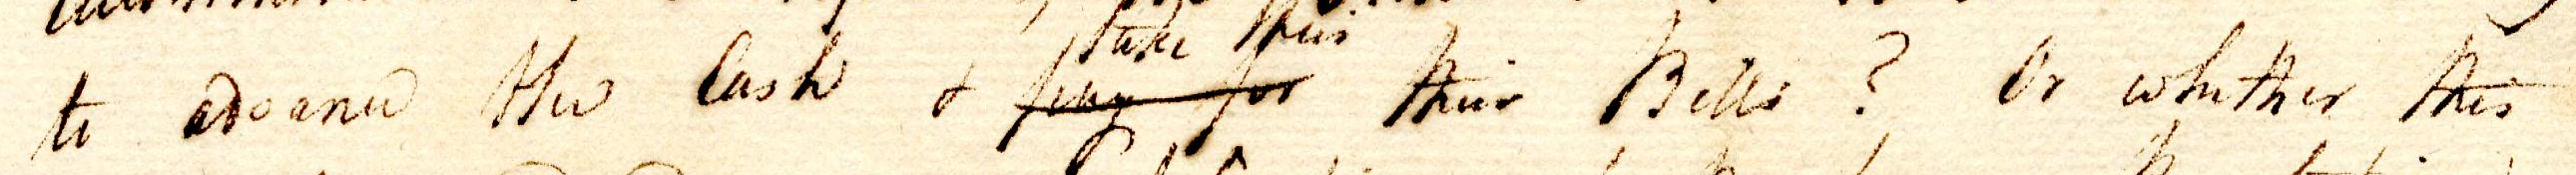to advance the cash & pay for their Bills? Or whether this
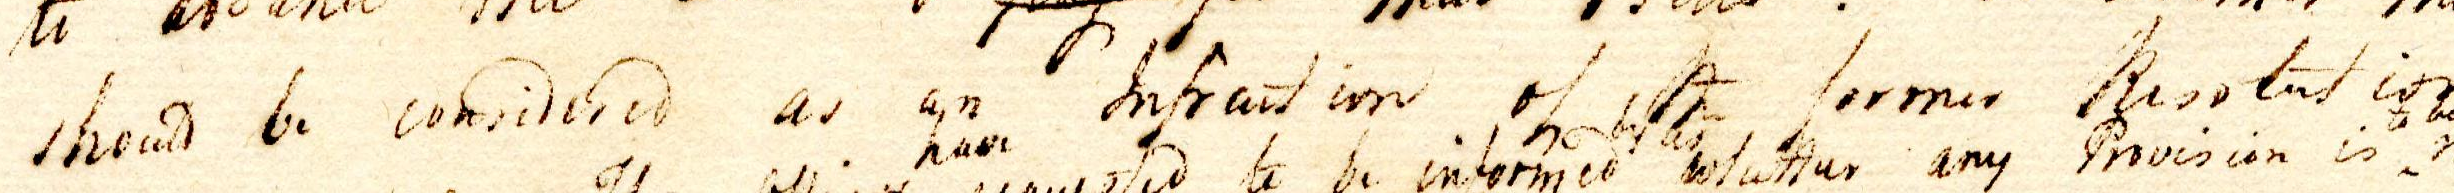should be considered as an Infraction of the former Resolution
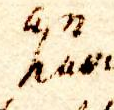have
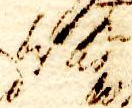by as
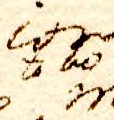to be
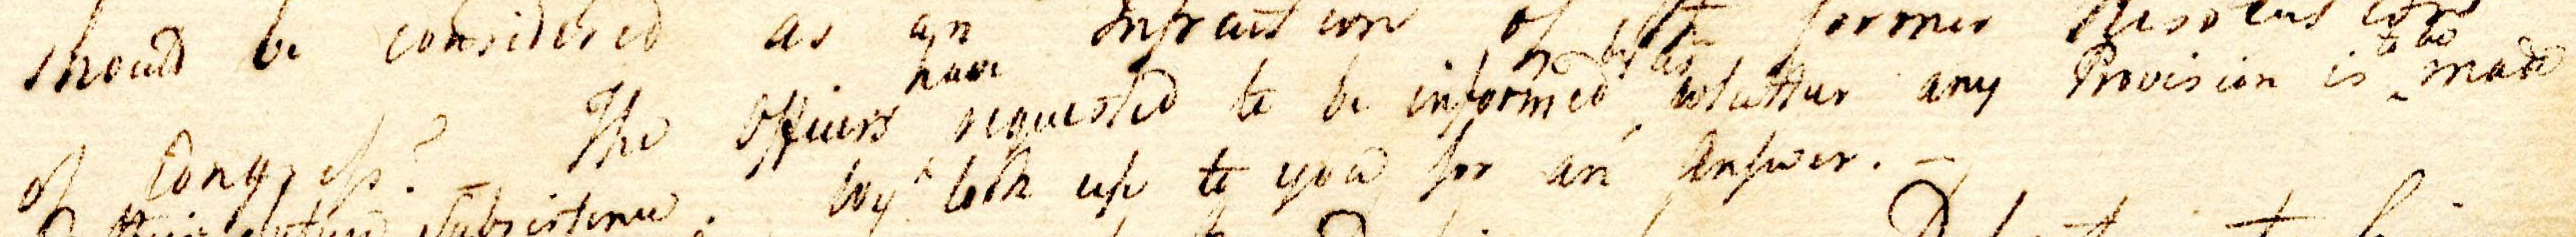of Congress? The Officers ^ requested to be informed ^ whether any Provision is ^ made
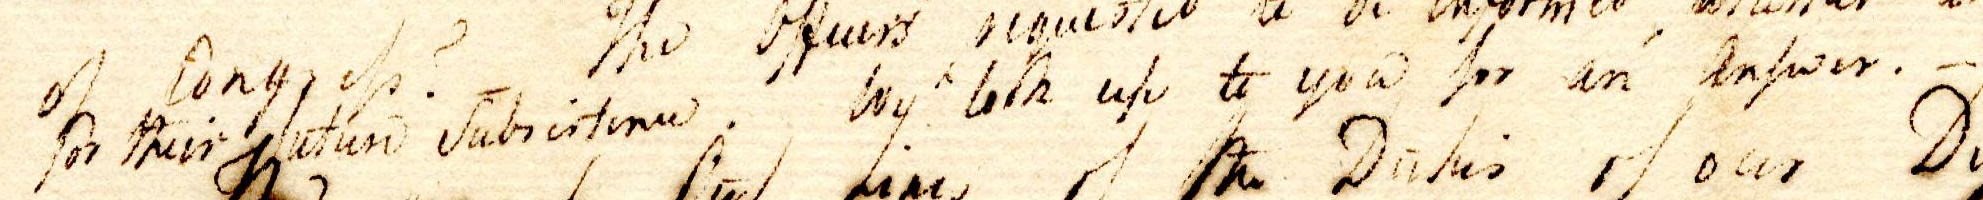for their future Subsistence. We look up to you for an Answer.
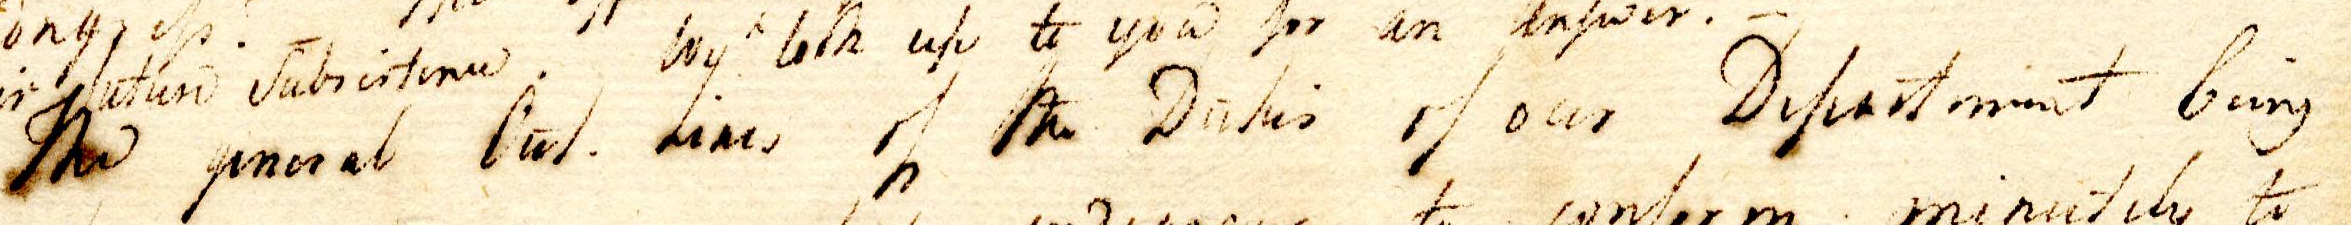The general Curt. Lines of the Dishes of our Department being
